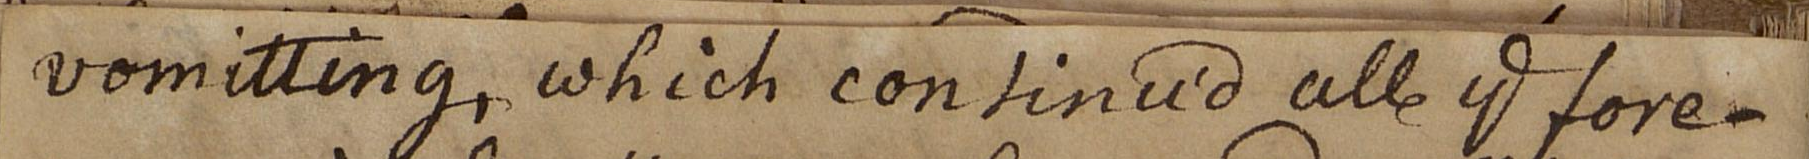vomitting, which continued all y^e fore-
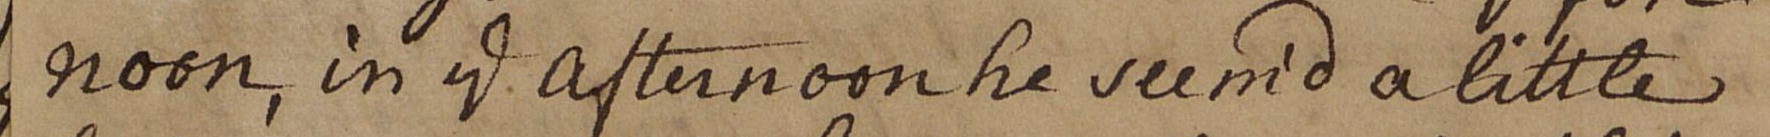noon, in y^e afternoon he seem'd a little
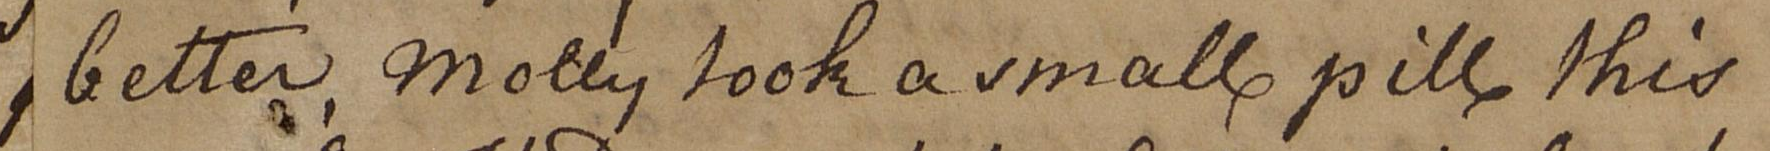better, Molly took a small pill this
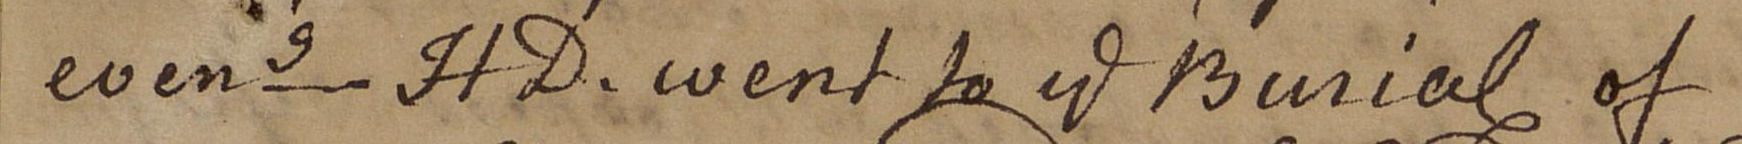even^g- HD. went to y^e Burial of
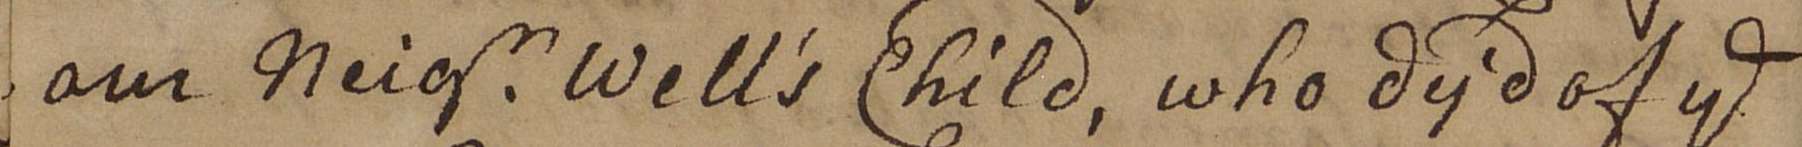our Neig^r. Well's Child, who dy'd of y^e
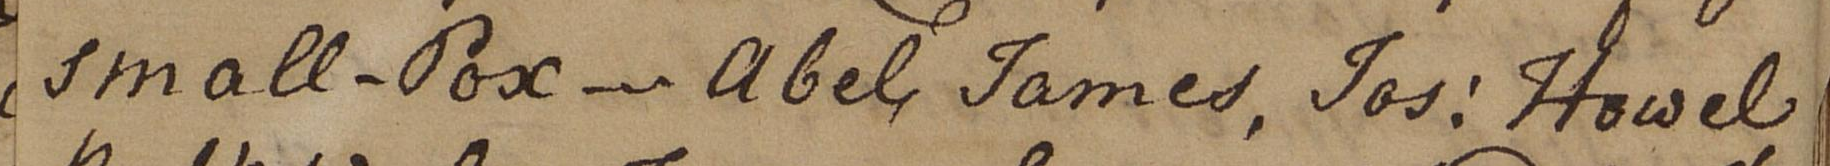Small- Pox- Abel James, Jos: Howel
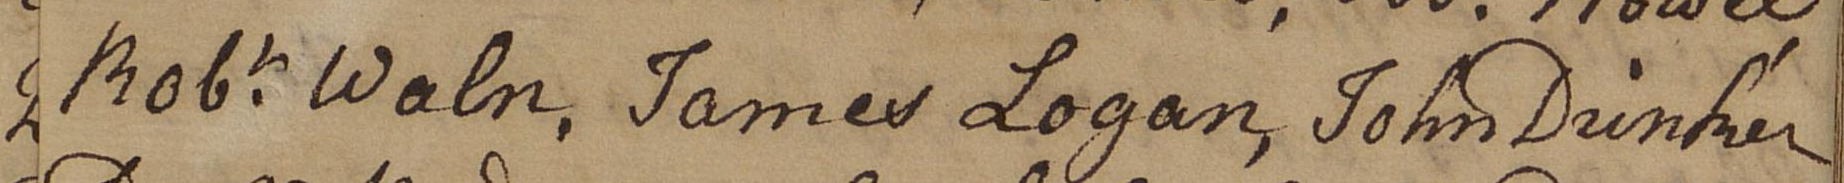Rob^t. Waln, James Logan, John Drinker
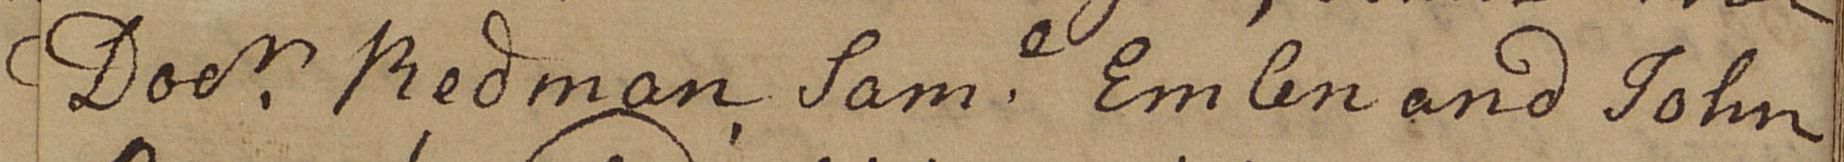Doc^r Redman, Sam.^l Emlen and John
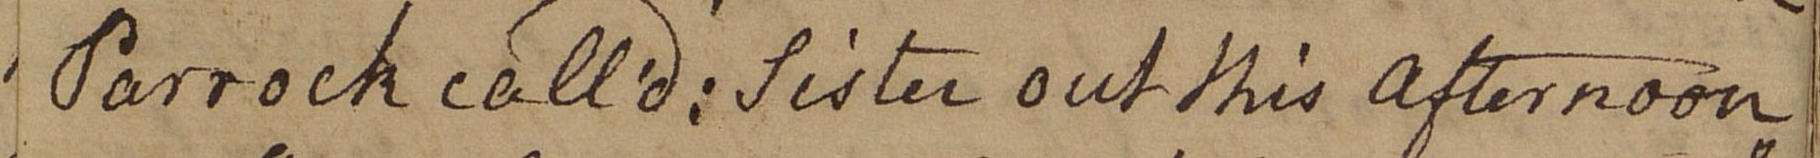Parrock call'd: Sister out this Afternoon
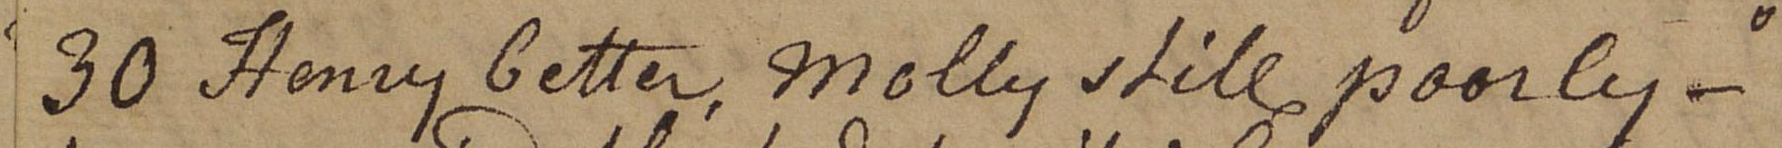30 Henry better, Molly still poorly-
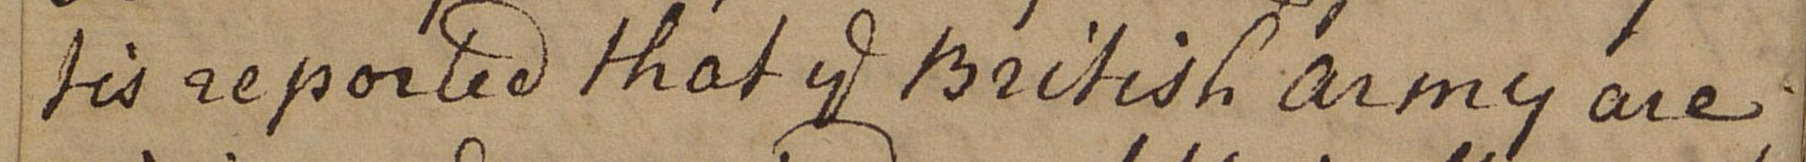tis reported that y^e British army are
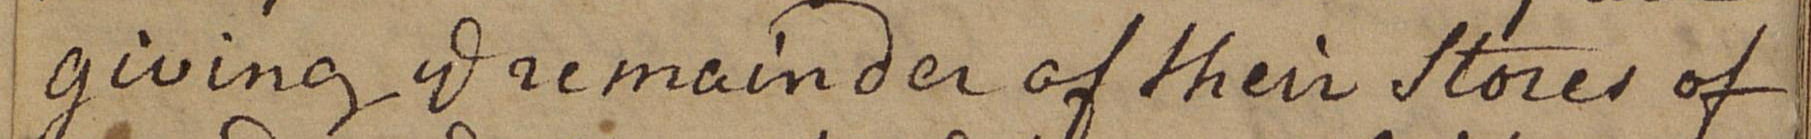giving y^e remainder of their Stores of
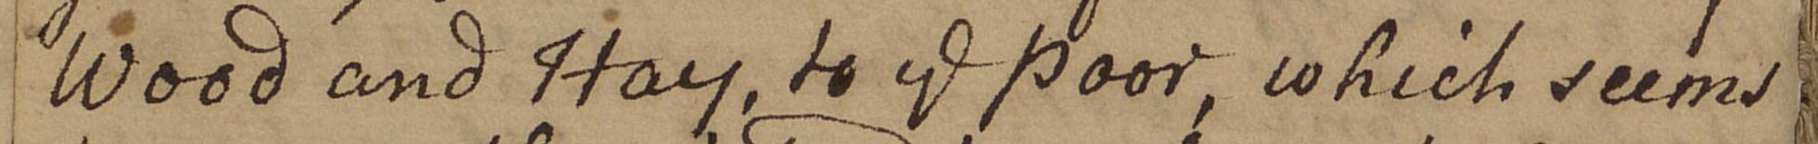Wood and Hay, to y^e Poor, which seems
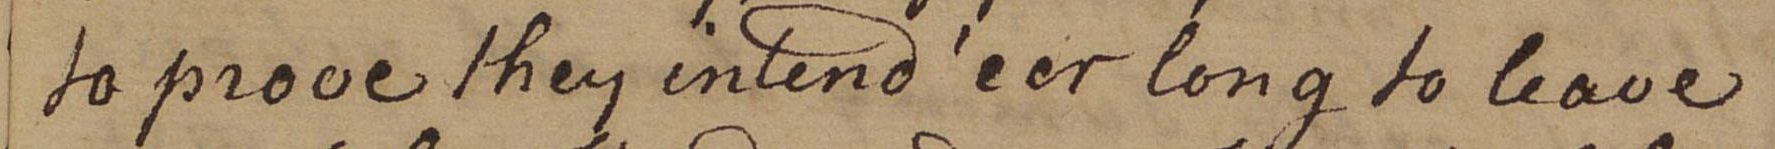to prove they intend ['e er] long to leave
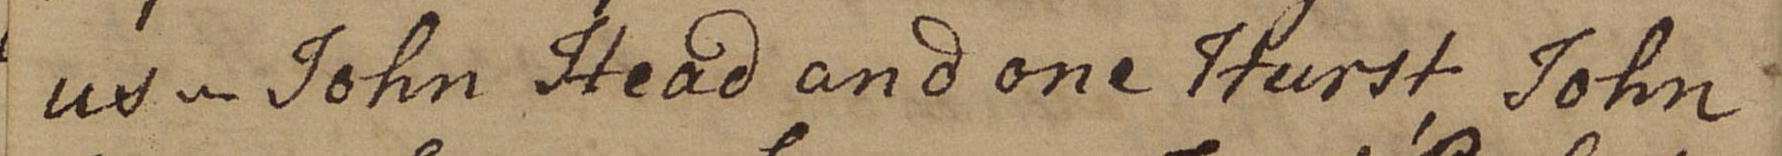us- John Head and one Hurst John
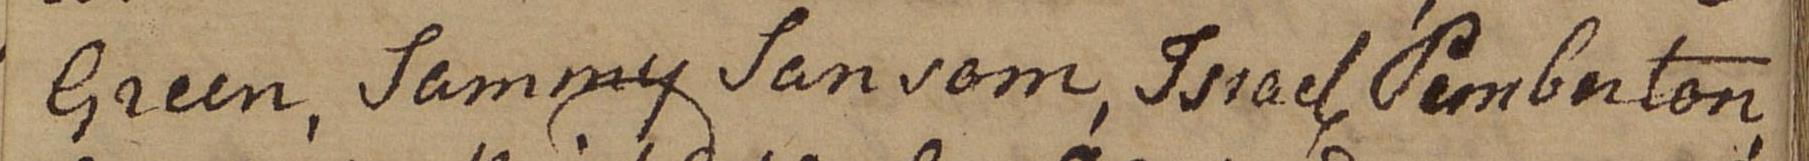Green, Sammy Sansom, Israel Pemberton,
